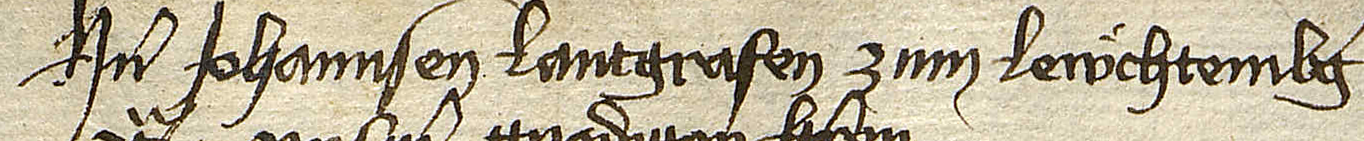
Hn* Iohannſen Lantgrafen ʒum Lewchtembg*
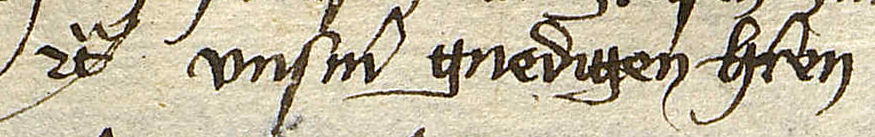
ec* vnſm* gnedigen hr*en
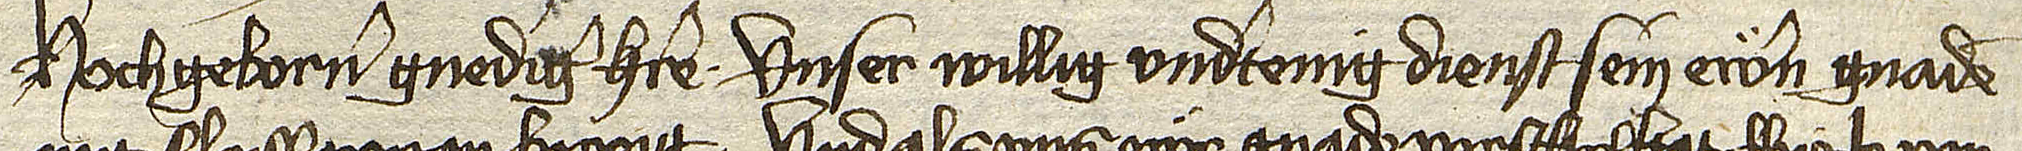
Hochgeborn* gnedig* hr*e . Vnſer willig vnd*tenig dienſt ſein ew*n gnade*
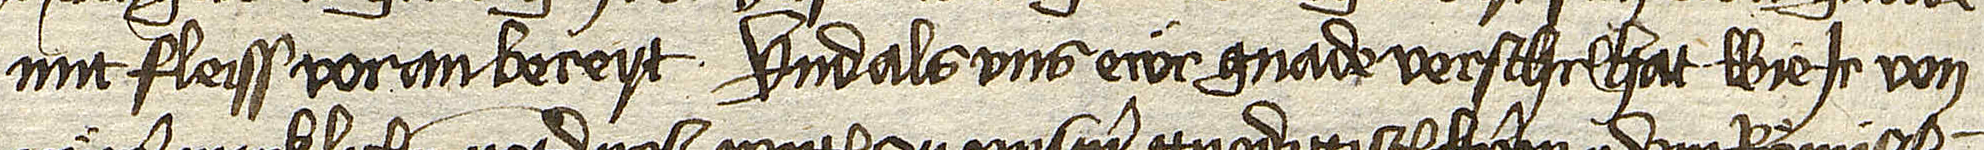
mit fleiſſ voran bereyt . Vnd als vns ewr gnade verſchr* hat wie Ir von
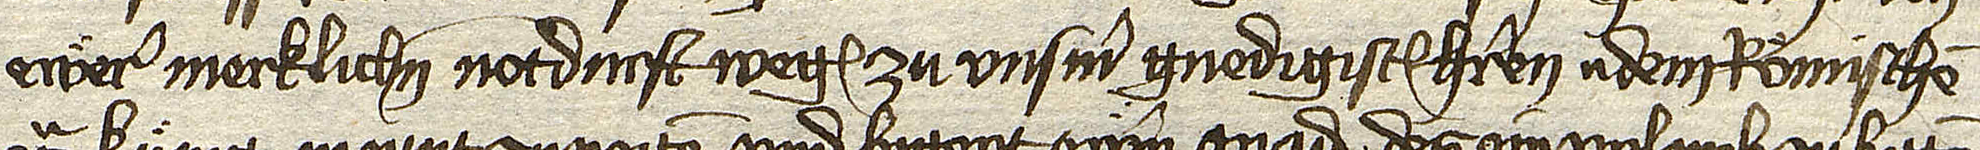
ewer* merklichn* notdurft weg* ʒu vnſm* gnedigiſt* hr*en ~ dem Römiſche*
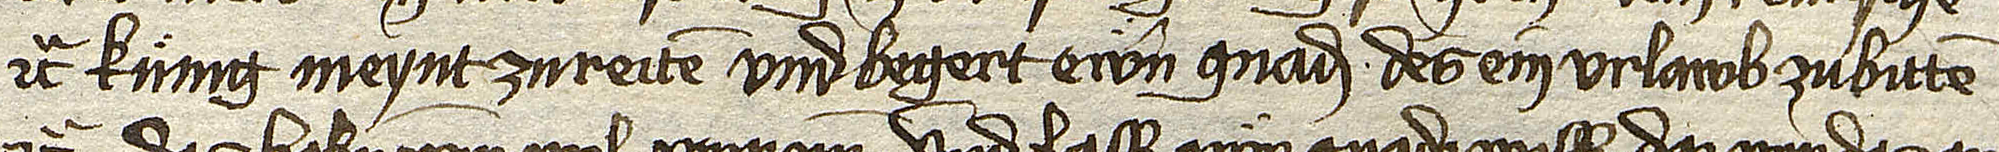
ec* künig meynt ʒureite* vnd begert ew*n gnad* . des ein vrlawb ʒubitte*
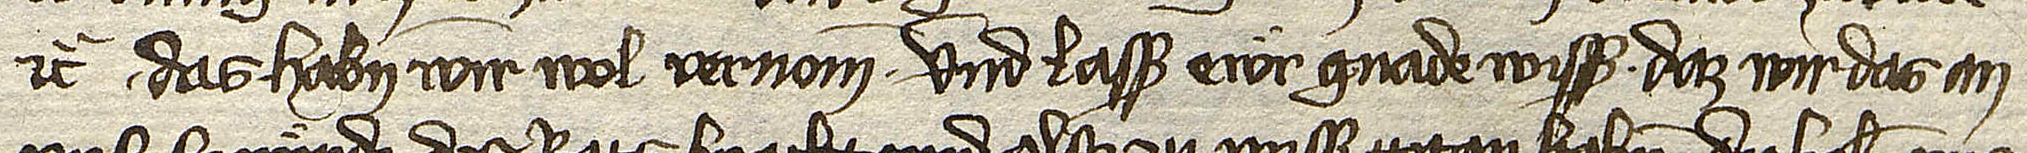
ec* / das habn* wir wol vernom* . Vnd laſſ* ewr gnade wiſſ* . daʒ wir das an
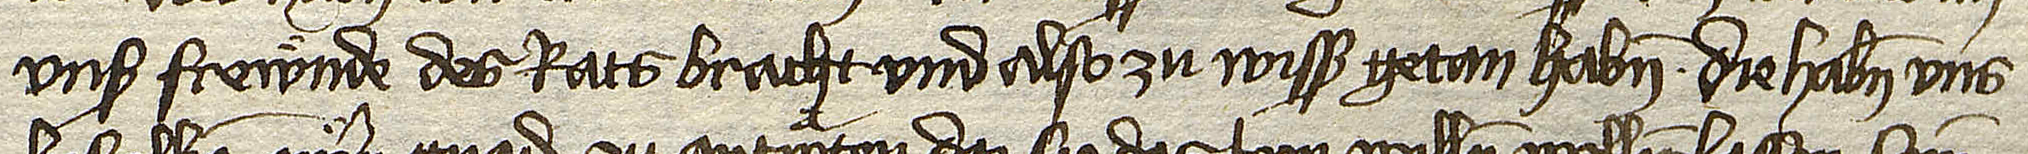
vnſ* frewnde des Rats bracht vnd alſo ʒu wiſſ* getan habn* . die habn* vns
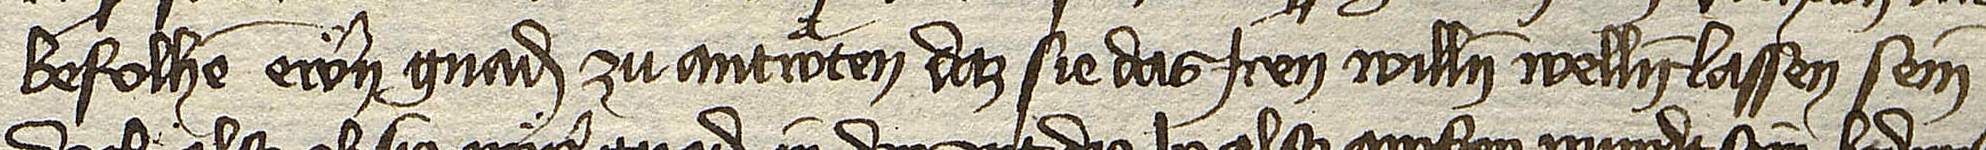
befolhe* ew*n gnad* ʒu antw*ten daʒ ſie das Iren willn* welln* laſſen ſein
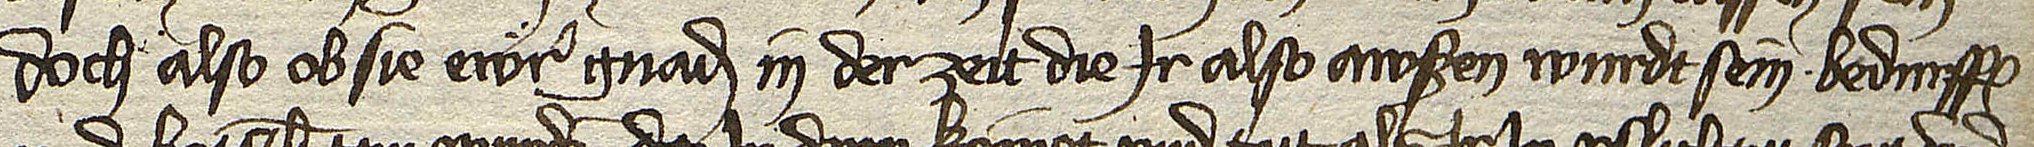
doch alſo ob ſie ewr* gnad* in der ʒeit die Ir alſo awſʒen wurdt ſein . bedurff*
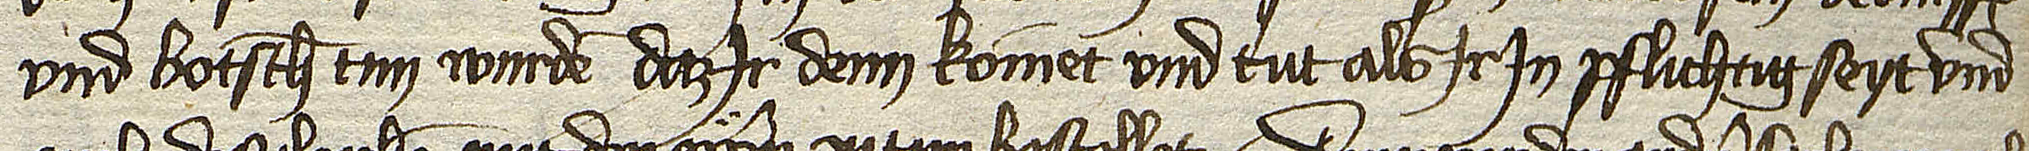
vnd botſch tun wurde* daʒ Ir denn kom*et vnd tut als Ir In pflichtig ſeyt vnd
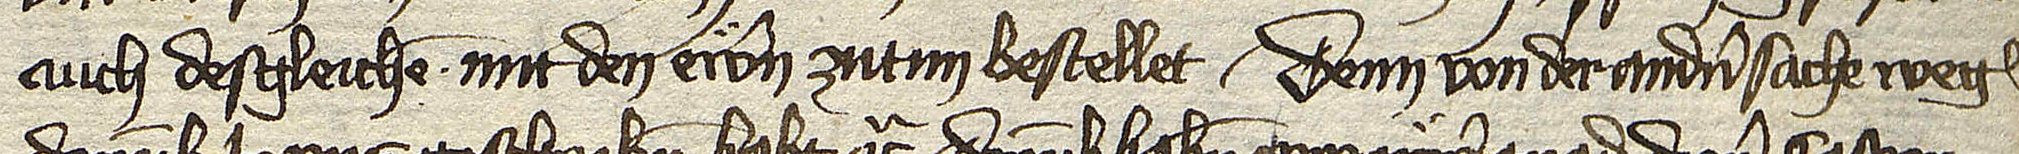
auch deſgleiche* . mit den ew*n ʒutun beſtellt / Denn von der andn* ſache weg*
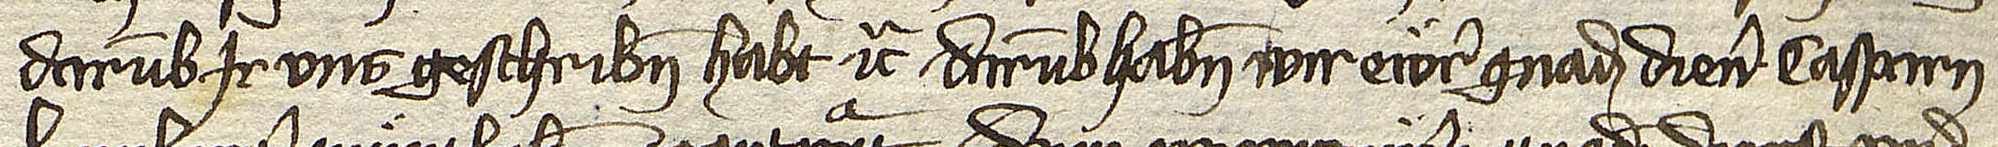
darub* Ir vns geſchribn* habt ec* / Darub* habn* wir ewr* gnad* dien* . Caſparn
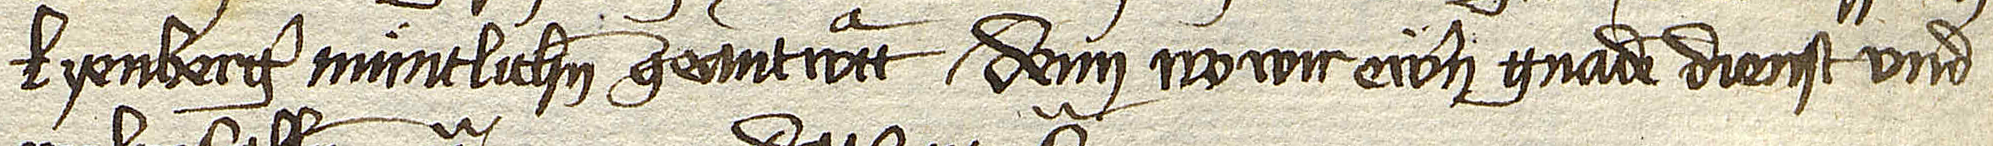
Lyenberg* müntlichn* geantw*tt / Denn wo wir ew*n gnade* dienſt vnd
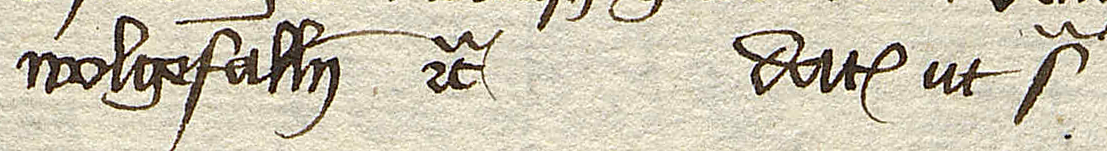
wolgefalln* ec* dat* ut ſ*
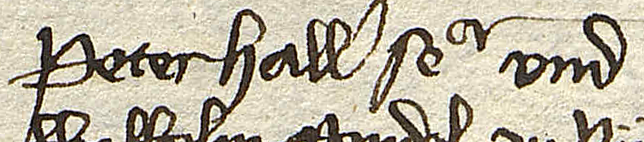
Peter hall* ſe* vnd
